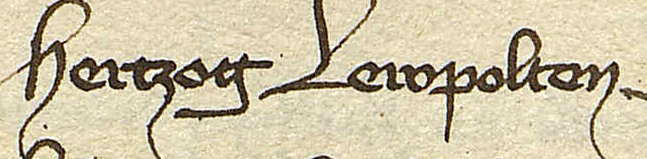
hercʒog Lewpolten
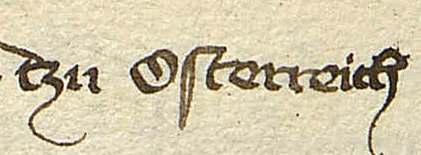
cʒu Oſterreich
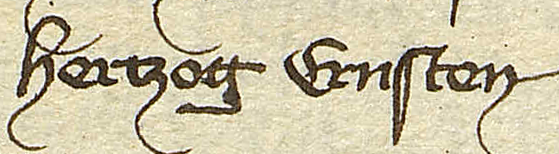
hercʒog Ernſten
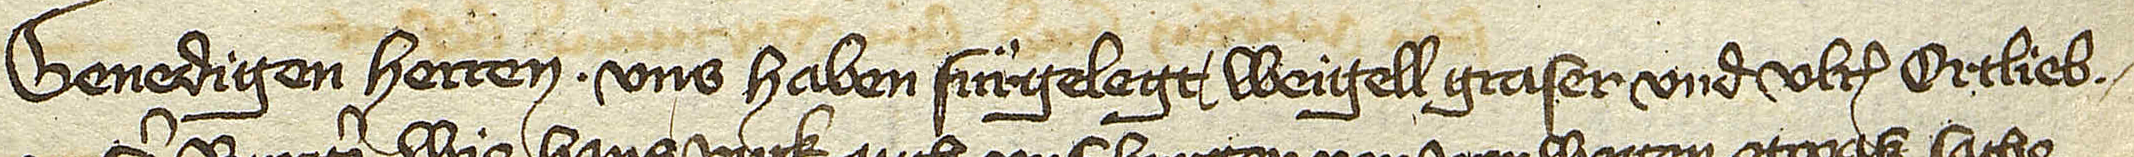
Gnedigen herren . vns haben fürgelegt / weigell graſer vnd vlr* Ortlieb . /
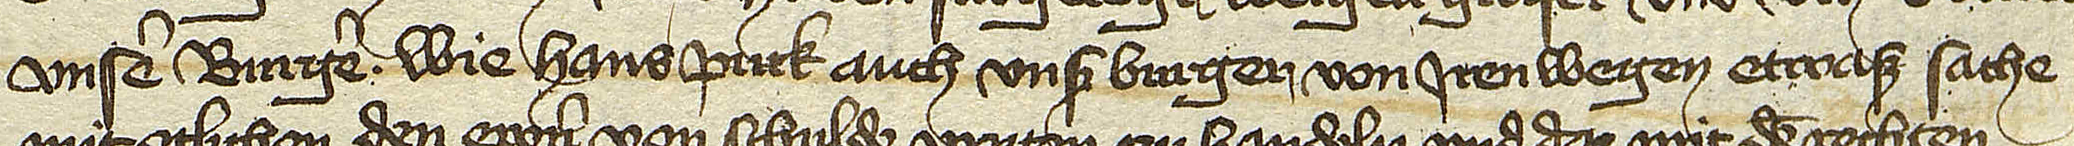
vnſe* Burge* . wie hans Puck auch vnſ* burger von Iren wegen etwaſʒ ſache
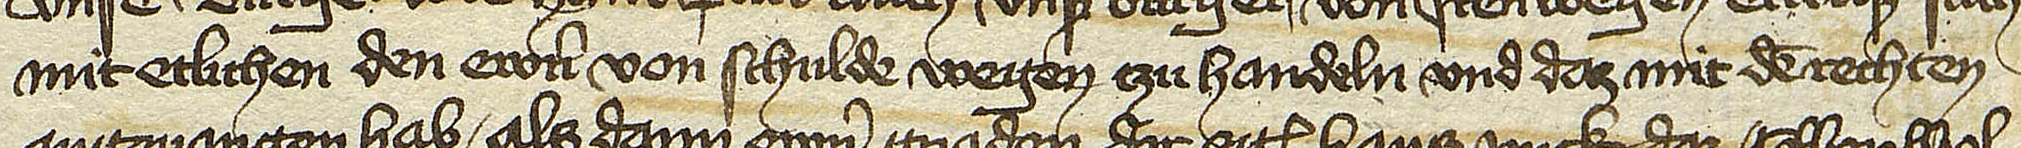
mit etlichen den ewn* von ſchulde wegen cʒu handeln vnd daʒ mit de* rechten
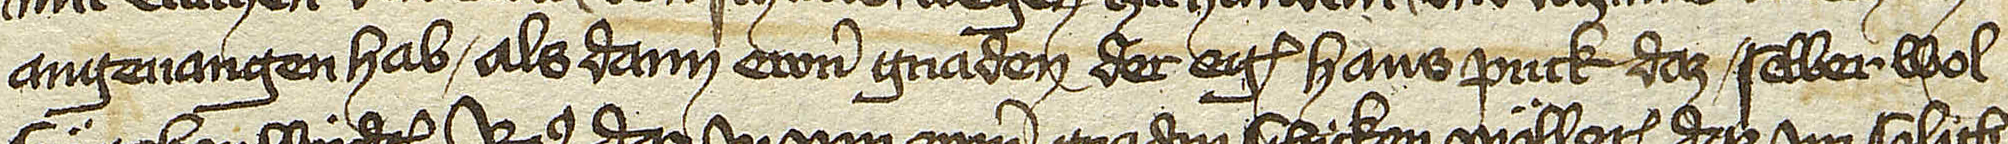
angeuangen hab / als dann ewn* gnaden der eg* hans Puck daʒ / ſelber wol
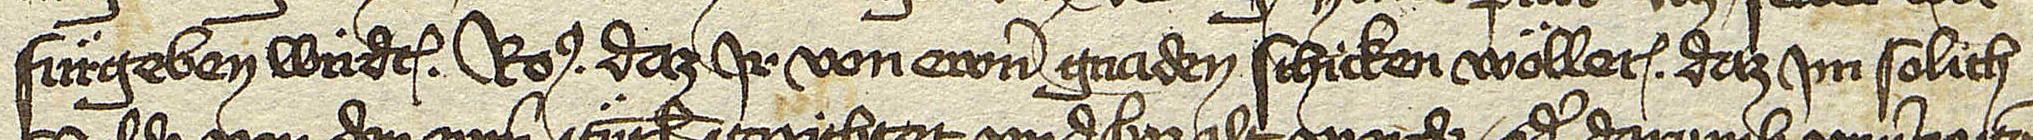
fürgeben wirdt* . Ro*. daʒ Ir von ewn* gnaden ſchicken wöllet* . daʒ Im ſolich
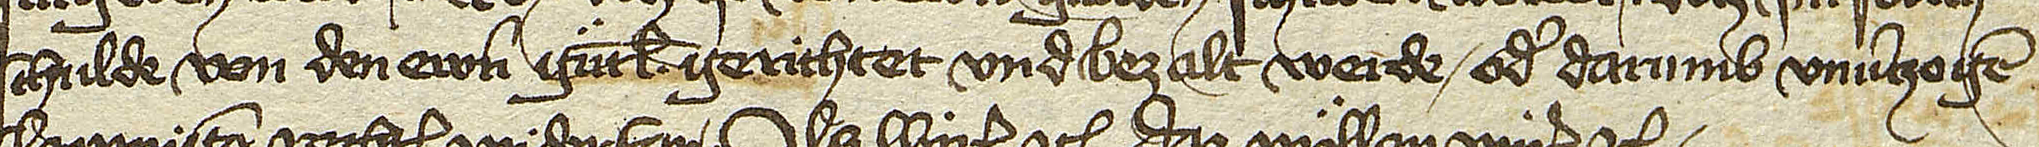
ſchulde von den ewn* gütl* gerichtet vnd beʒalt werde / od* darumb vnu*cʒoge*
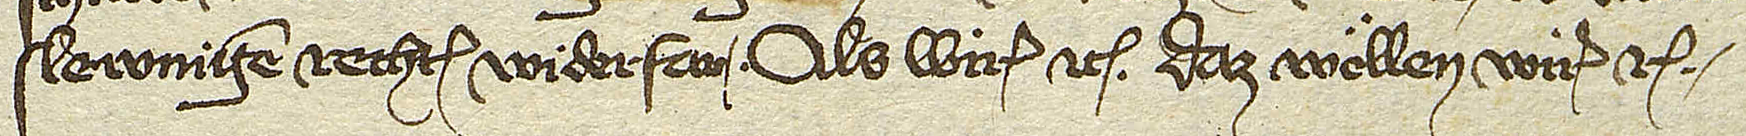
ſlewnige* recht* widerfar* / . Als wir* ec* daʒ wöllen wir* ec* . /
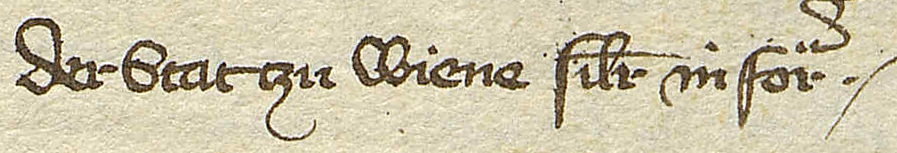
der Stat cʒu Wiene ſilr* in for* . /
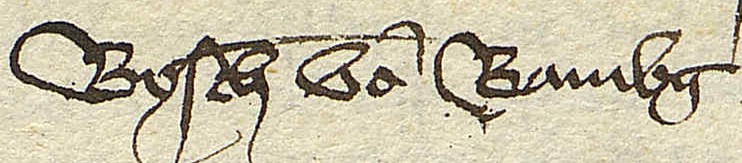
Byſch* vo* Bambg*
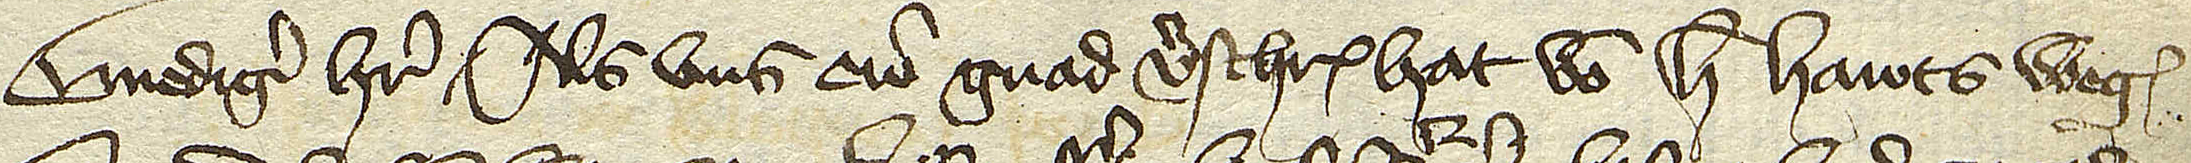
Gnedig* hr* / Als vns ew* gnad v*ſchr* hat vo* h* hawts weg*
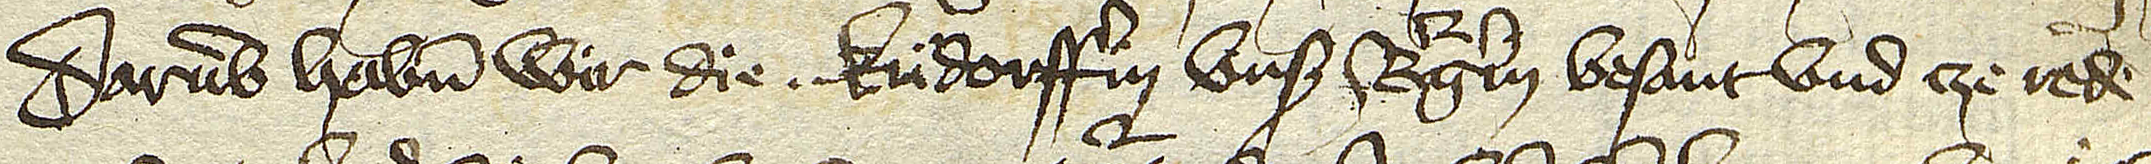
Darub* habn* wir die ~ küdorff*in vnſ* B*g*in beſant cʒe rede
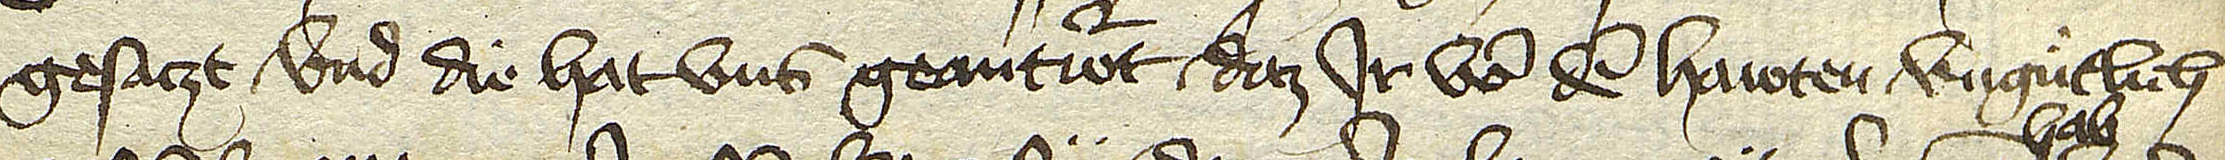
geſacʒt / vnd die hat vns geantw*t / daʒ Ir vo* d* hawten / vngütlich
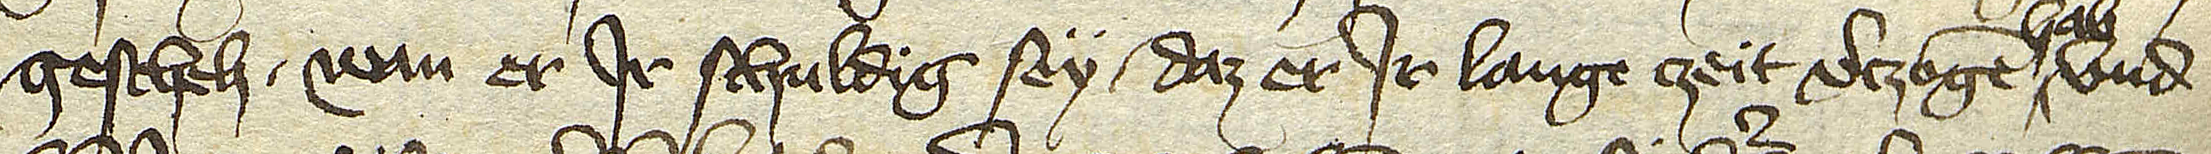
geſcheh / wan er Ir ſchuldig ſey / daʒ er Ir lange cʒeit v*cʒoge* vnd
